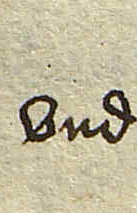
vnd
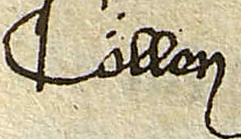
Cöllen
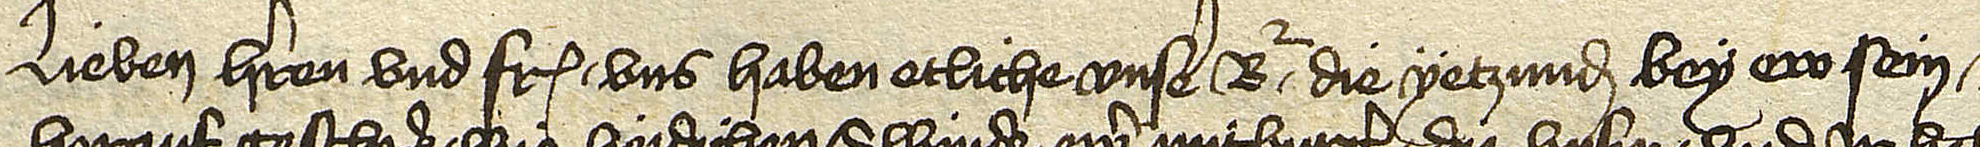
Lieben h*ren vnd fr* / vns haben etliche vnſe* B* / die yetʒund* bey ew ſein /
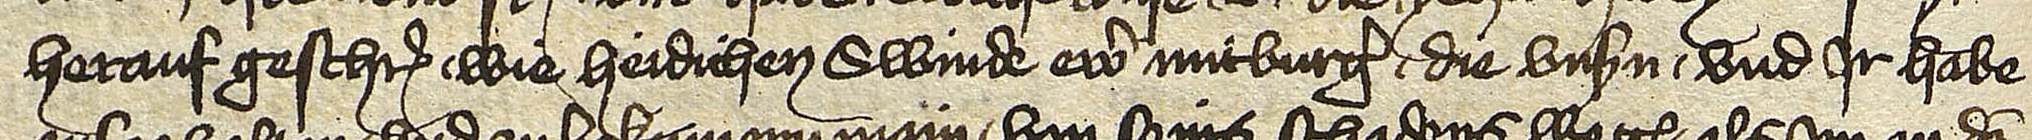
herauf geſchr* / wie heidichen Swinde ew* mitburg* / die vnſ*n / vnd Ir habe
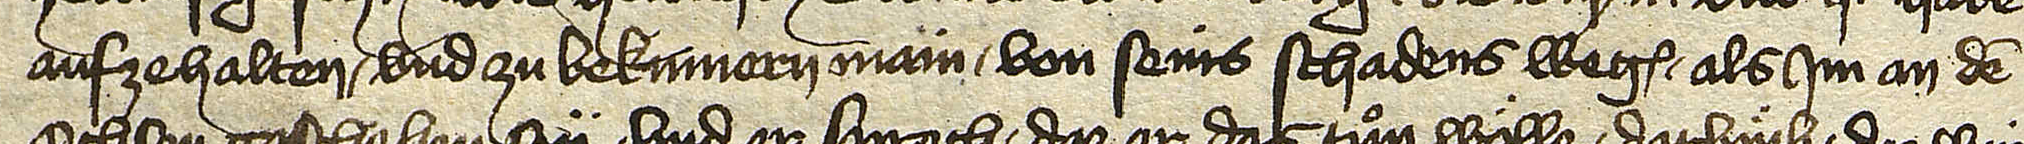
aufʒehalten / vnd cʒu bekumern main / von ſeins ſchadens weg* / als Im an d*
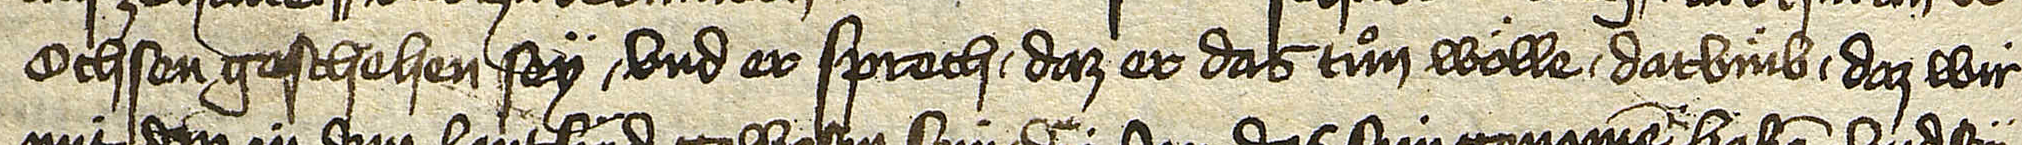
Ochſen geſchehen ſey / vnd er ſprech / daʒ er das tün wölle / darv̈mb / daʒ wir
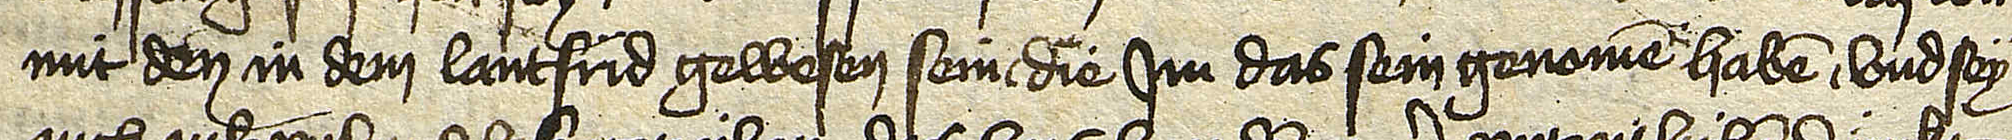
mit den in dem lantfrid geweſen ſein / die Im ſein genome* habe* / vnd ſey
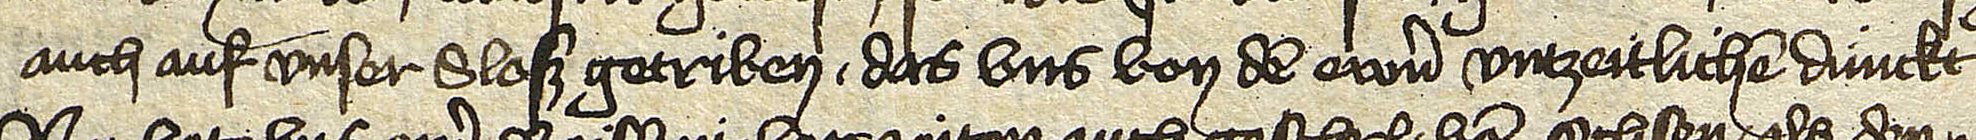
auch auf vnſer Sloſʒ getriben / das vns von de* ewn* vntʒeitliche* dünckt
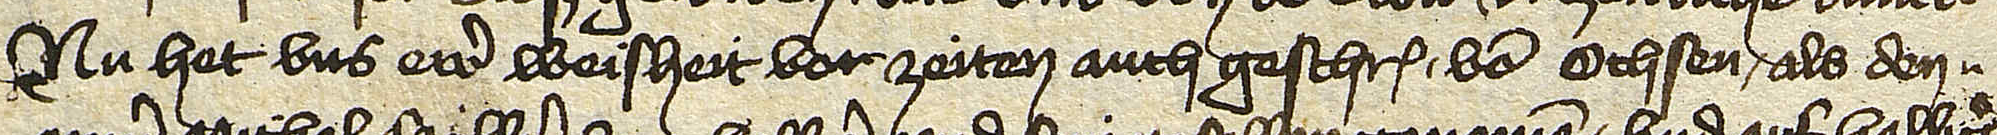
Nu het vns ew* weiſheit vor cʒeiten auch geſchr* / vo* Ochſen / als den
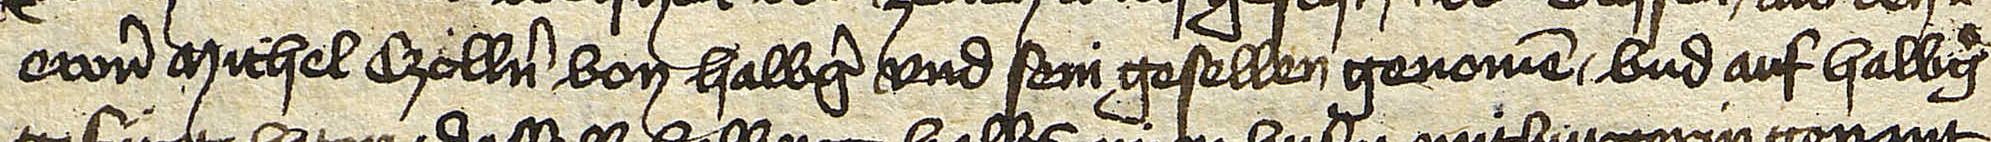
ewn* Michel Cʒölln* von halbg* vnd ſein geſellen genome* / vnd auf halbg*
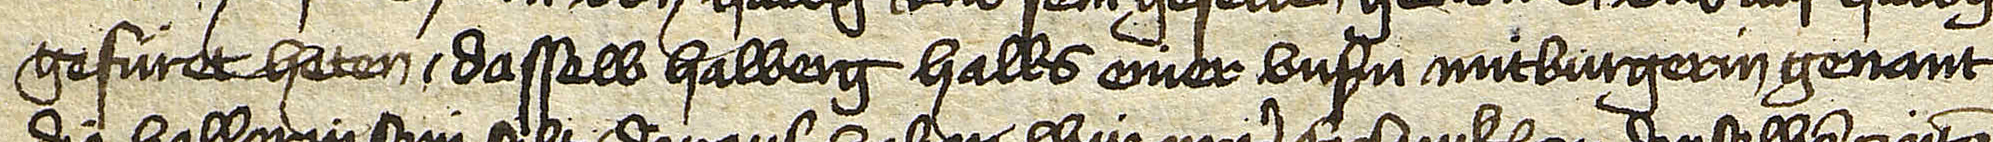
gefüret heten / daſſelb halberg halls einer vnſ*n mitburgerin genant
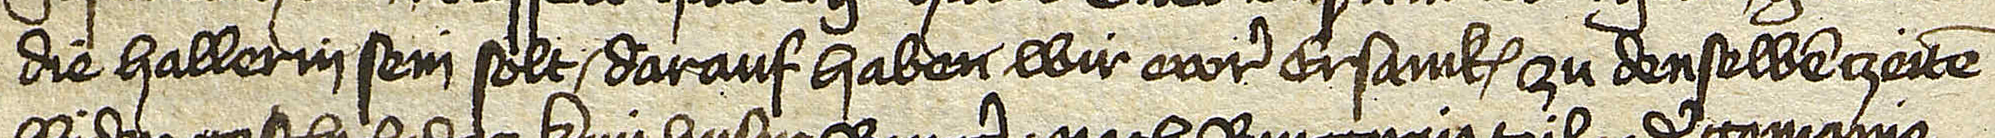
die hallerin ſein ſolt / darauf haben wir ewr* Erſamk* cʒu denſelbe* cʒeite*
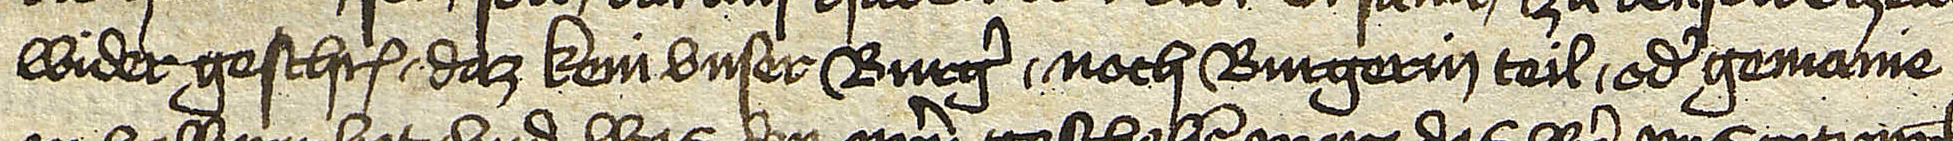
wider geſchr* / daʒ kein vnſer Burg* / noch Burgerin teil / od* gemaine
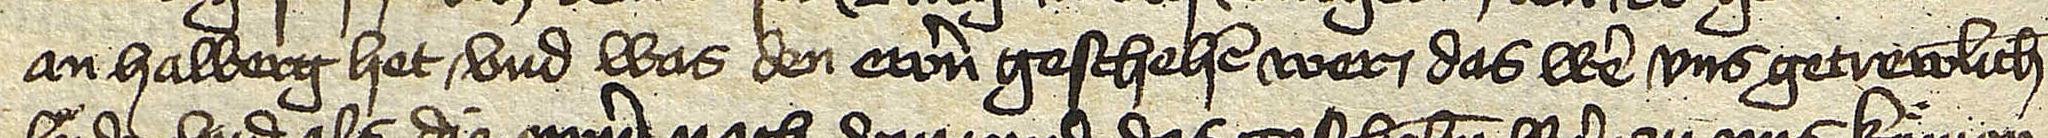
an halberg het / vnd was den ewn* geſchehe* wer / das we* vnd getrewlich*
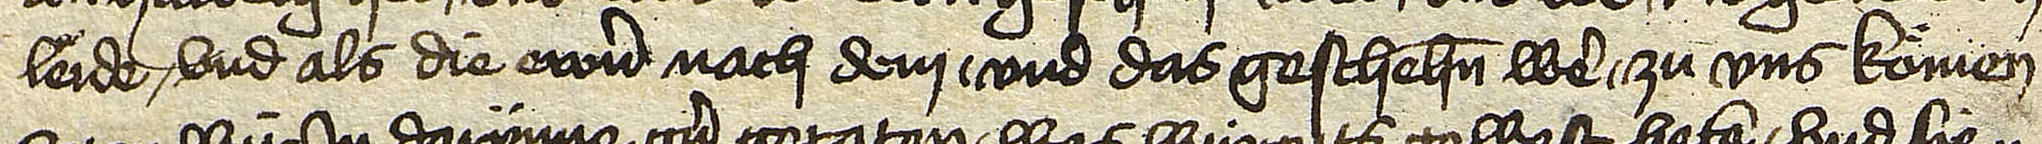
leide / vnd als die ewn* nach dem / vnd das geſchehn* we* / cʒu vns kömen
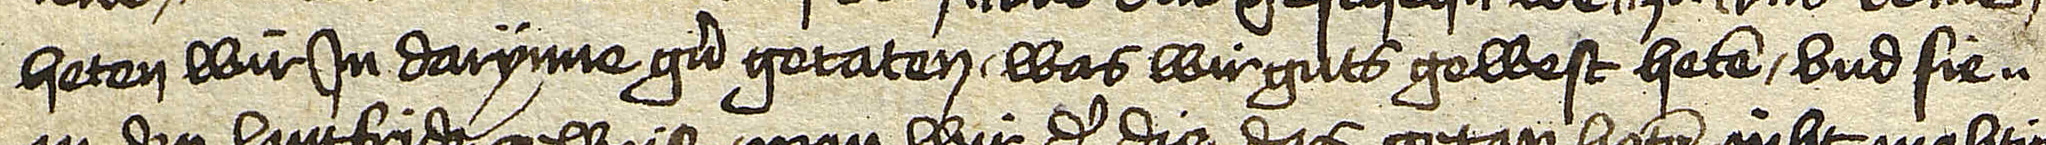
heten wir In darynne gn* geraten / was wir guts geweſt hete* / vnd ſie ~
